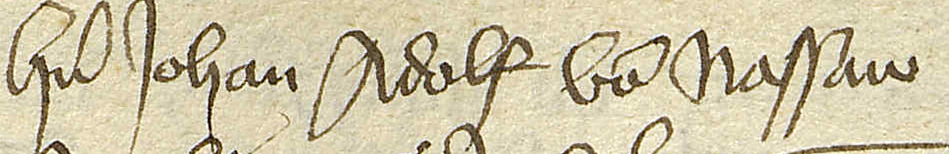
hn* Iohan Adolf vo* Naſſaw
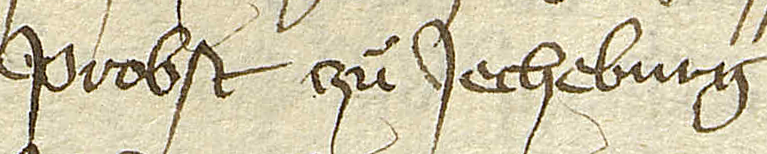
Probſt cʒü Iecheburg
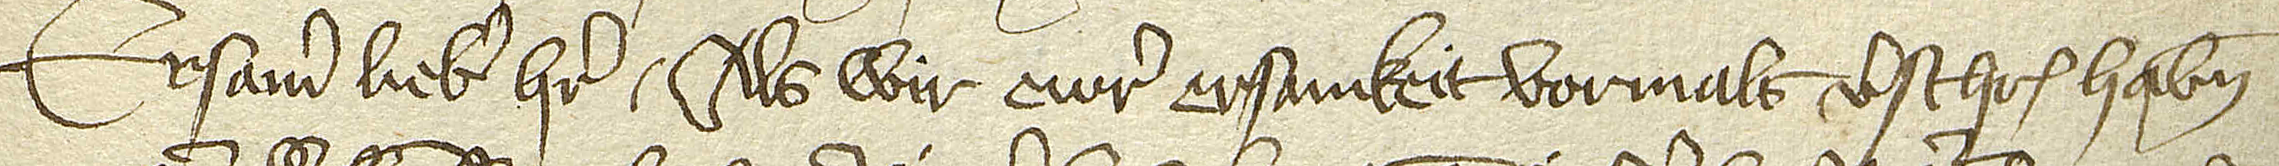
Erſam* lieb* hr* / Als wir ewr* erſamkeit vormals v*ſchr* habn*
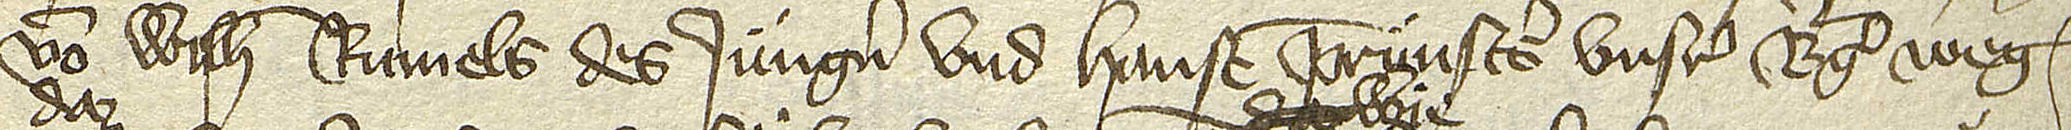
vo* Wilh* Rumels des Iüngn* vnd hanſe Prünſts* vnſr* B*g* weg*
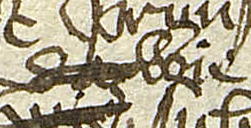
da wie
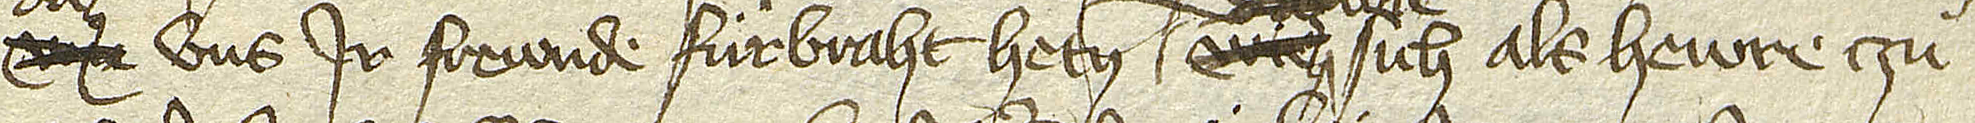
wie vns Ir frewnde fürbraht hetn* / wie ſich als hewre cʒü
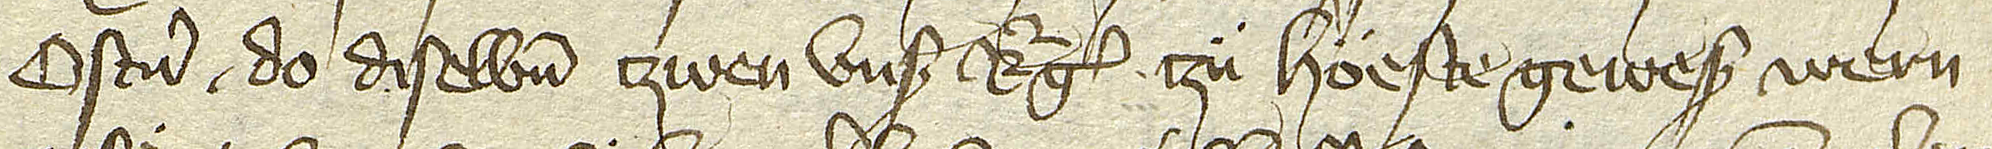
Oſtn* / do diſelbn* cʒwen vnſ* B*g* cʒü höeſte* geweſ* wern
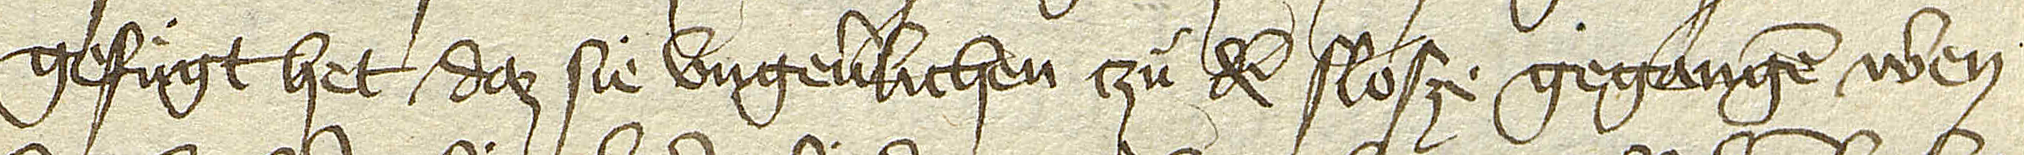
gefügt het / daʒ ſie vngeu*lichen cʒü d* ſloſʒe gegange* w*en
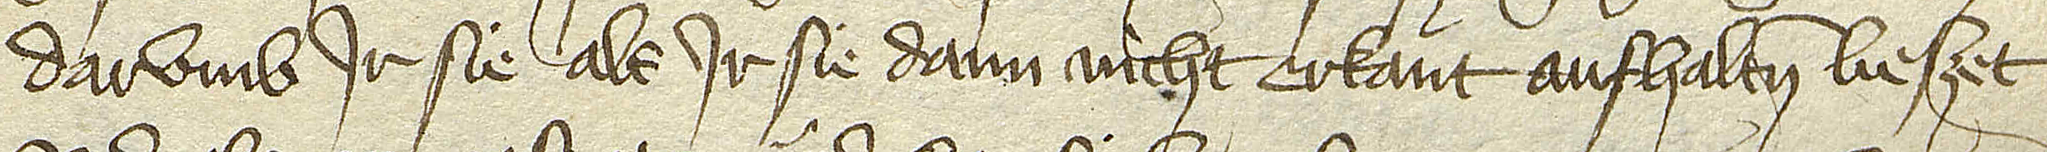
darvmb Ir ſie als Ir ſie dann nicht erkant aufhaltn* lieſʒet
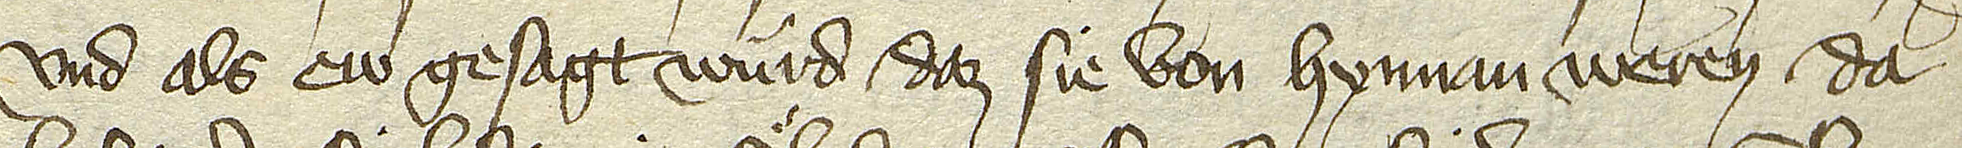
vnd als ew geſagt würd / daʒ ſie von hynnan weren / da
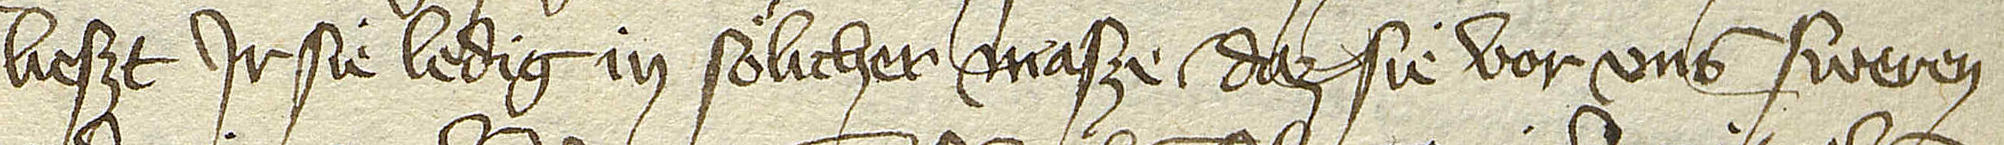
lieſʒt Ir ſie ledig in ſölicher maſʒe / daʒ ſie vor vns ſweren
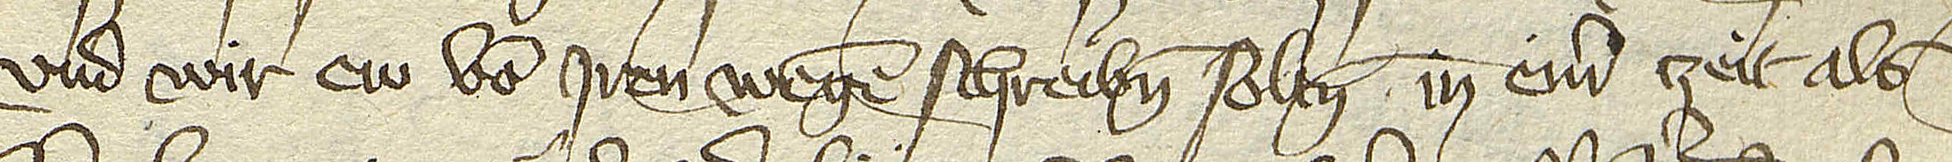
vnd wir ew vo* Iren wege* ſchreibn* ſoltn* in ein* cʒeit als
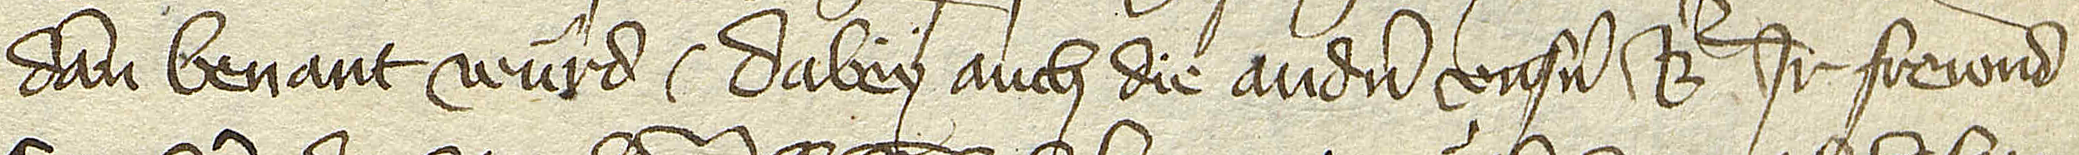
dan* benant würd / Dabey auch die andn* vnſn* B* Ir frewnd
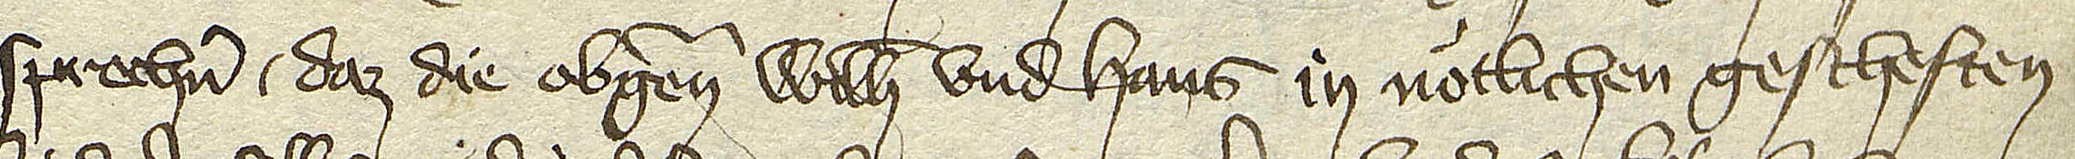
ſprechn* / daʒ die obgen* Wilh* vnd Hans in nötlichen geſcheften
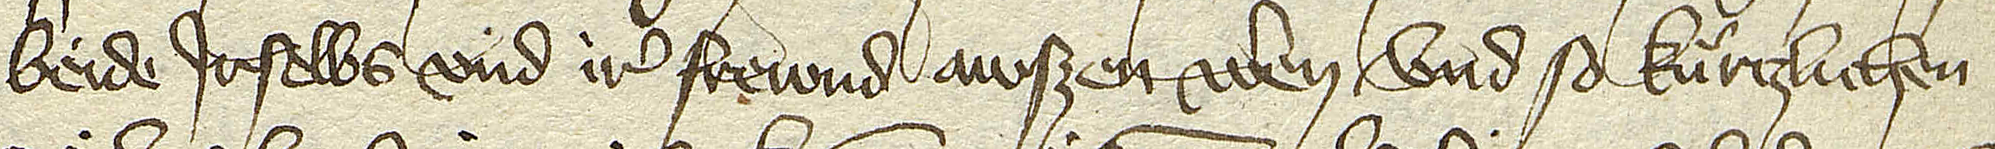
beide Irſelbs vnd ir* frewnd awſʒen w*en / vnd ſo kürcʒlichen
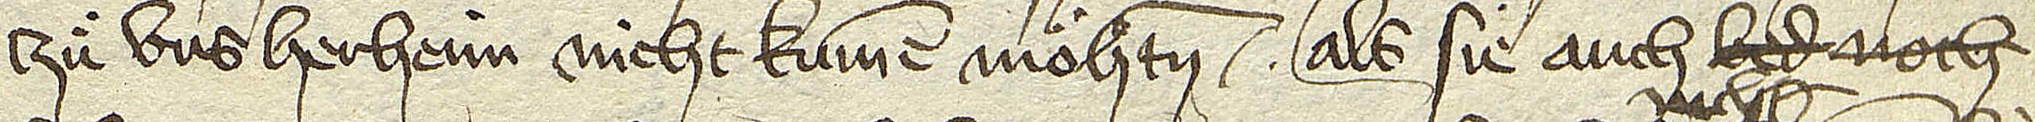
cʒü vnd herheim nicht kume* möhtn* / . als ſie auch bed noch
